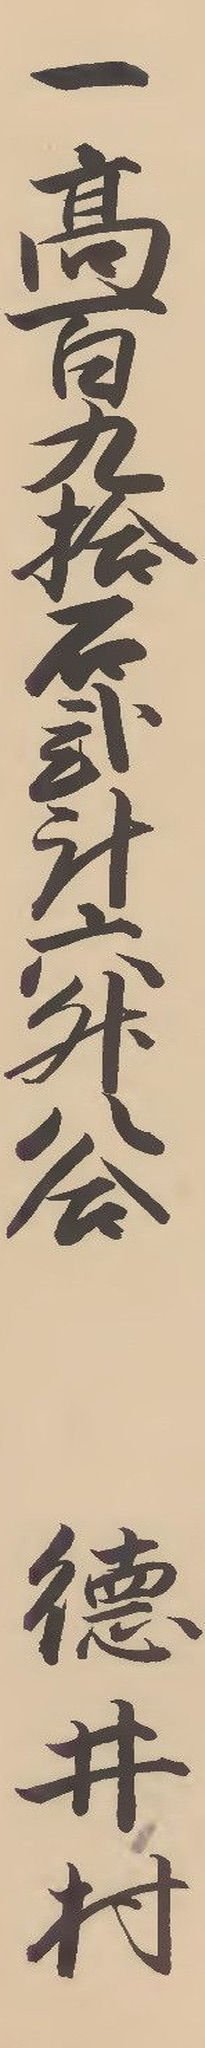一高百九拾弐斗六升八合徳井村

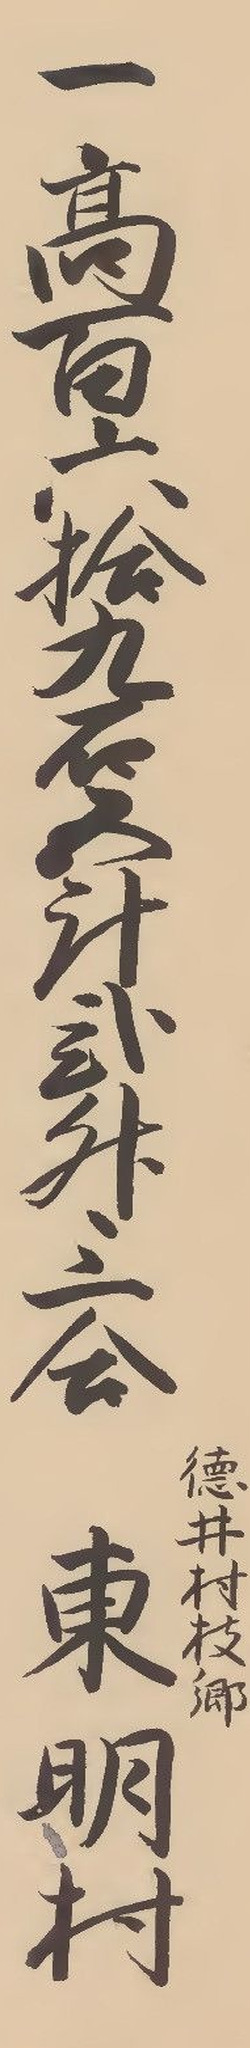一高百六拾九石五斗弐升三合東明村
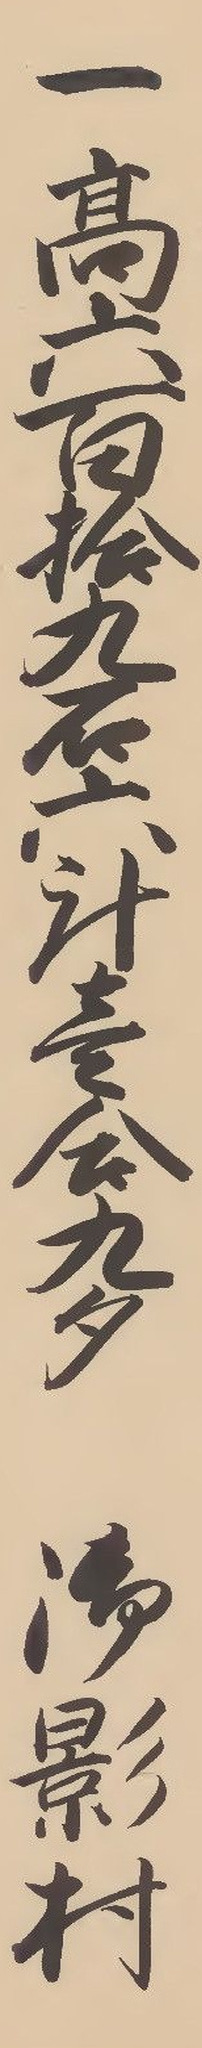一高六百拾九石六斗壱合九勺御影村
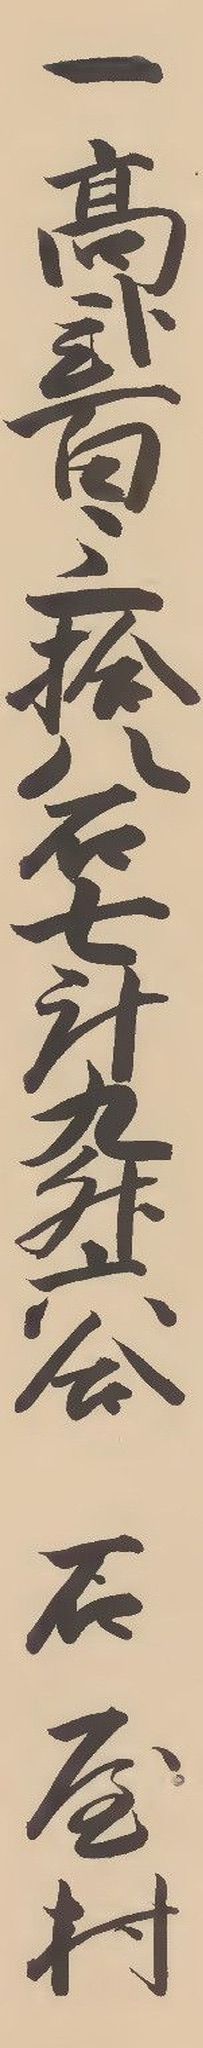一高弍百三拾八石七斗九升六合石屋村
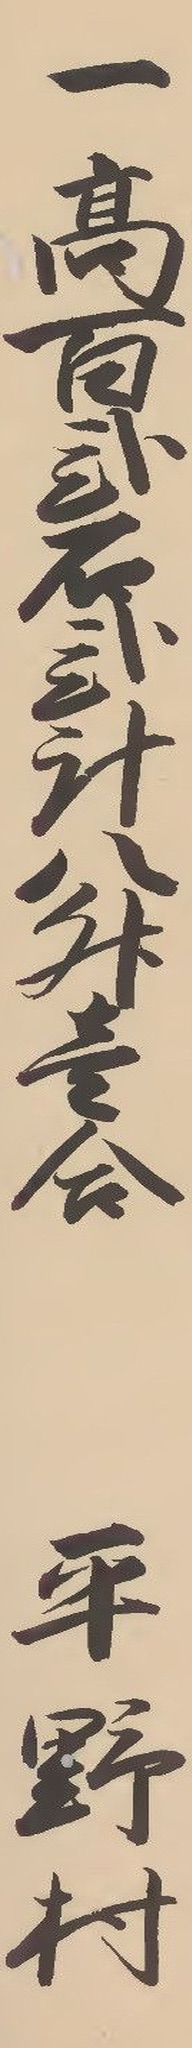一高百弐石弐斗八升壱合平野村
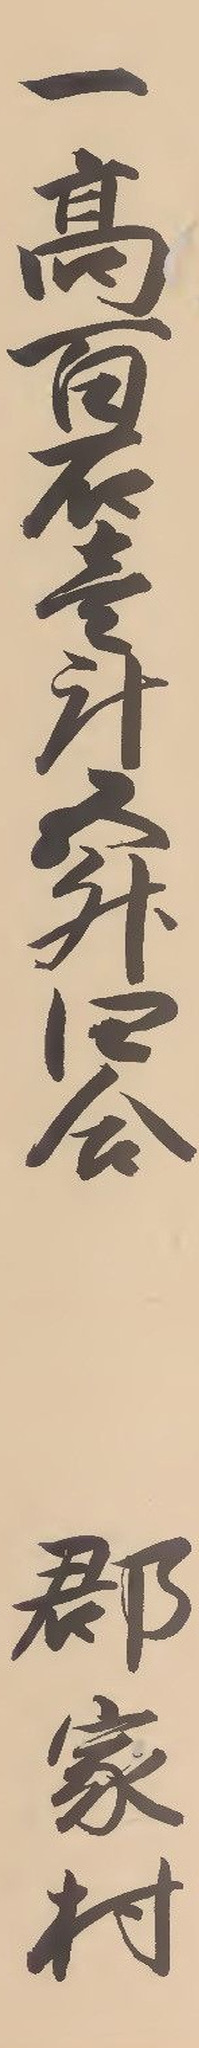一高百石壱斗五升四合郡家村
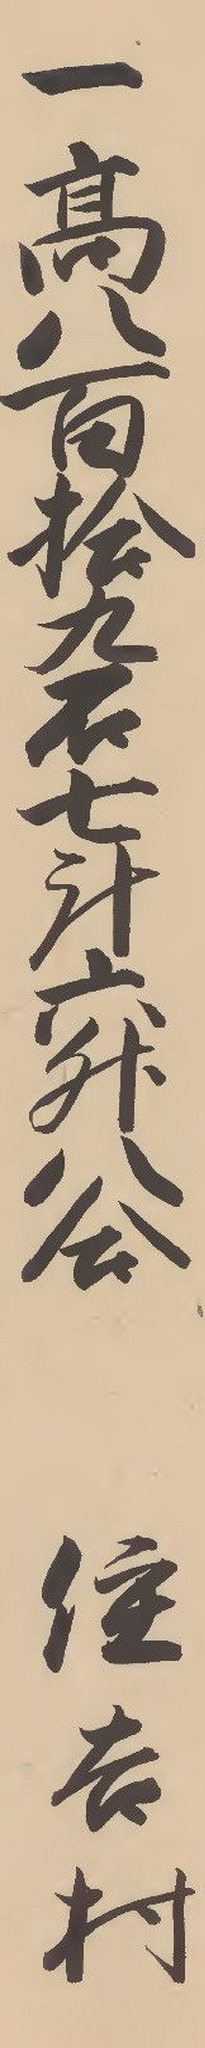一高八百拾九石七斗六升八合住吉村
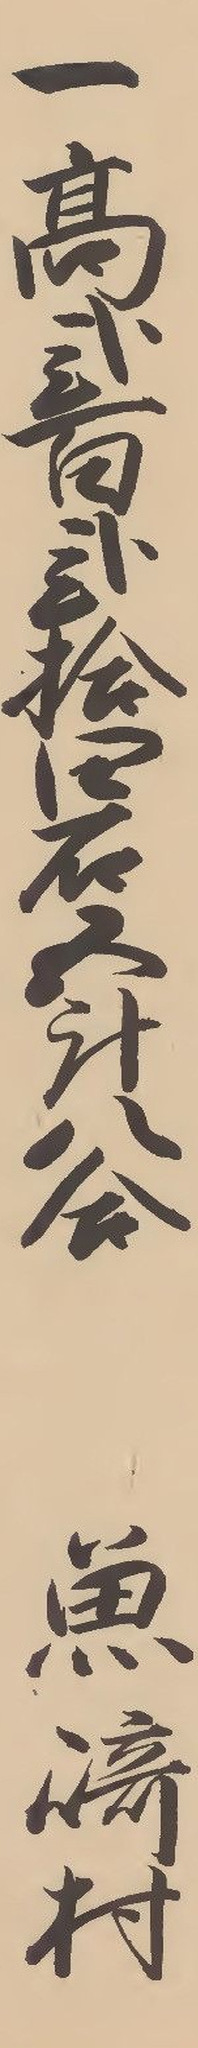一高弍百弐拾四石五斗八合魚崎村
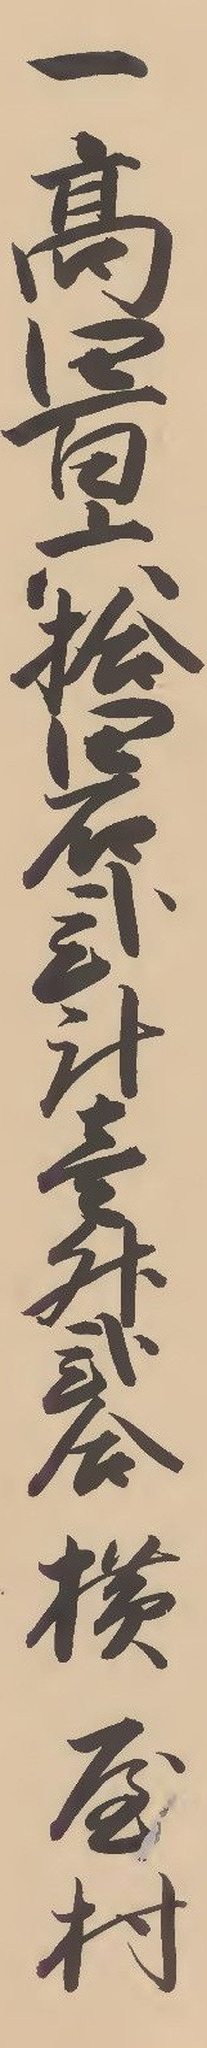一高四百六拾四石弐斗壱升弐合横屋村

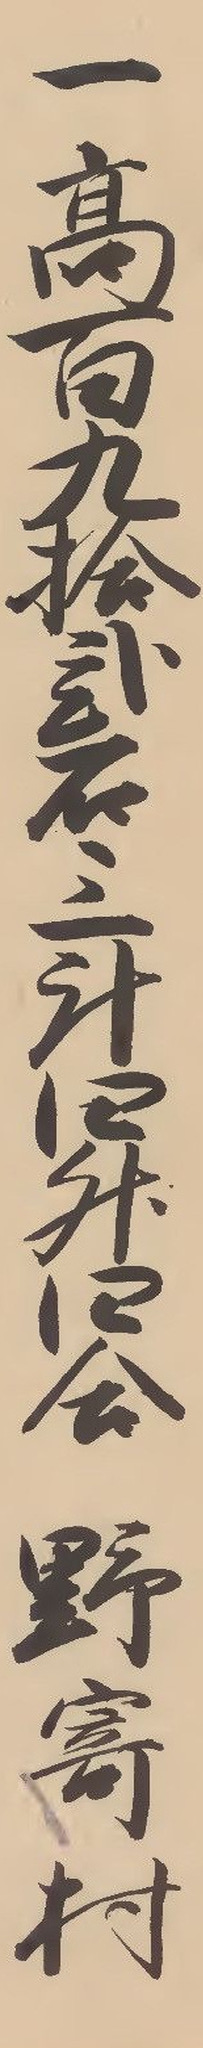一高百九拾弐石三斗四升四合野寄村
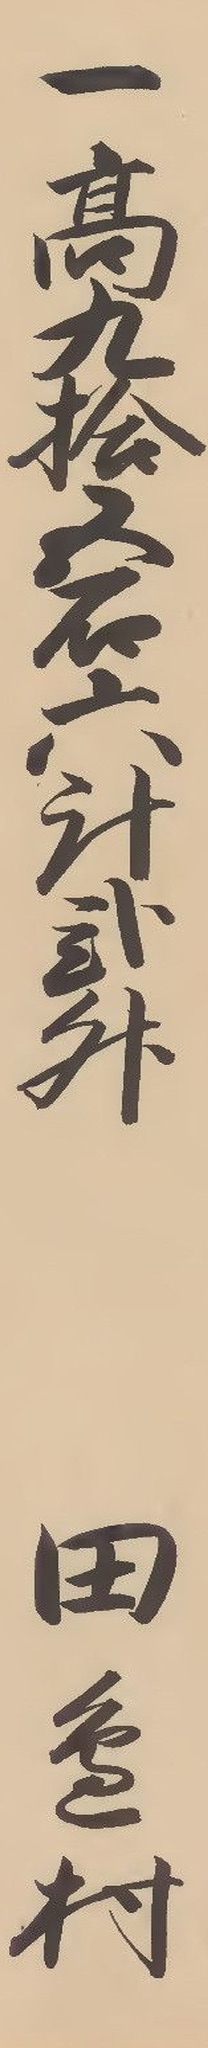一高九拾五石六斗弐升田辺村
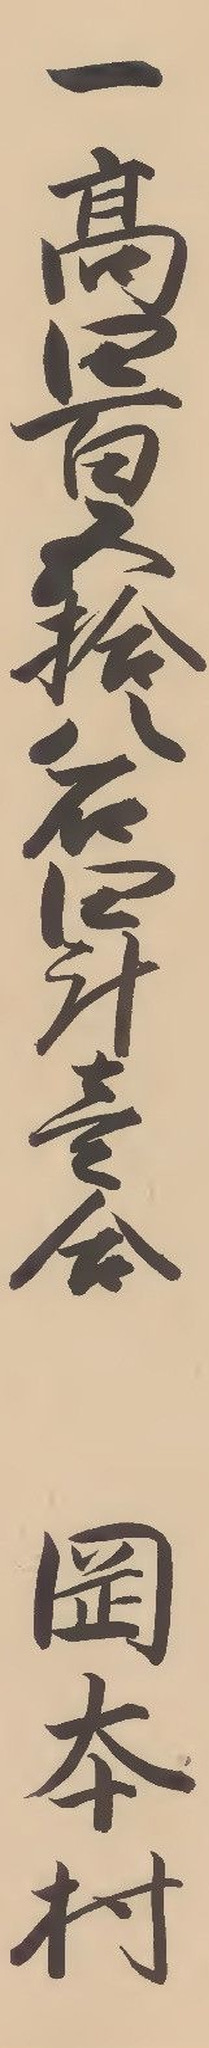一高四百五拾八石四斗壱合岡本村
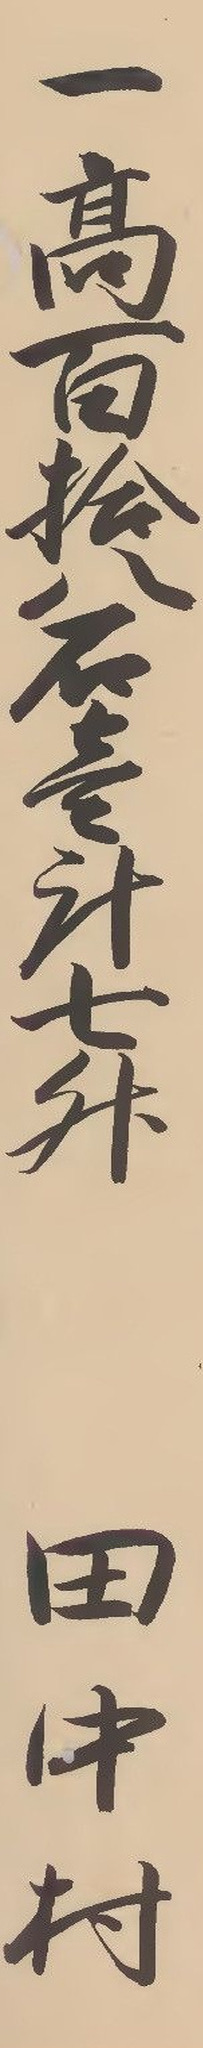一高百拾八石壱斗七升田中村
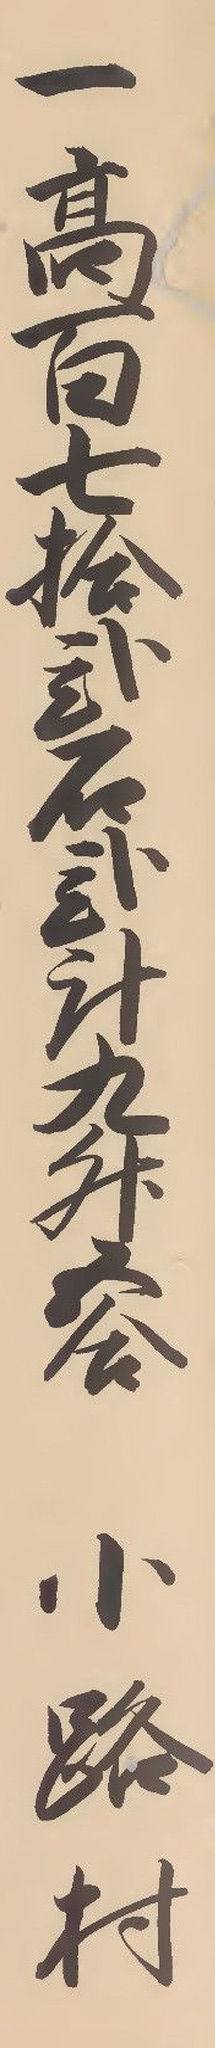一高百七拾弐石弐斗九升五合小路村
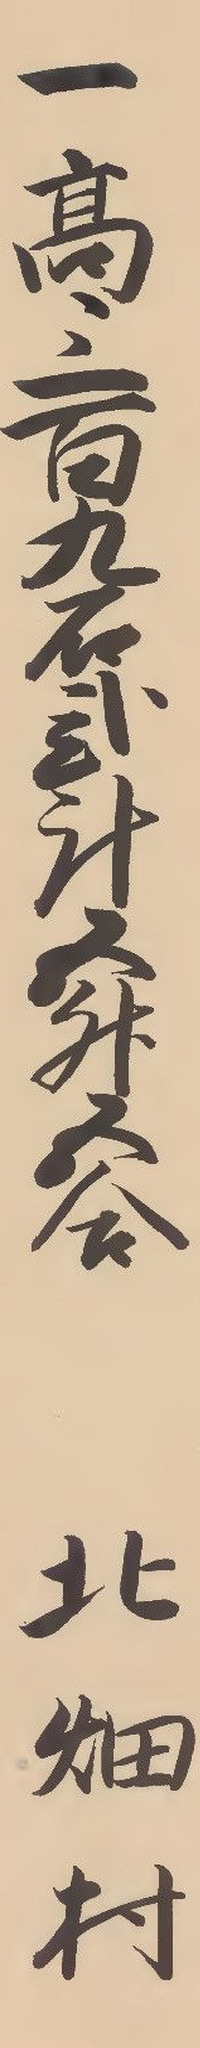一高三百九石弐斗五升五合北畑村
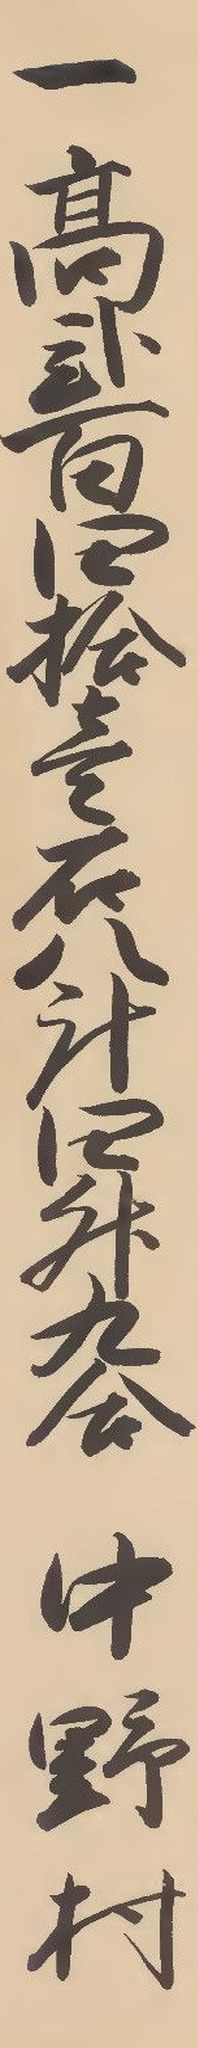一高弍百四拾壱石八斗四升九合中野村
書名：摂津国郷帳
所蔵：国立公文書館 National Archives of Japan
